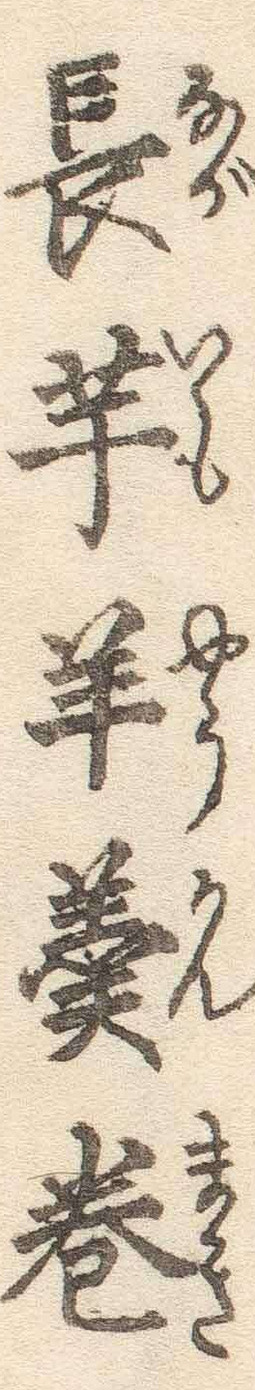長芋羊羹巻
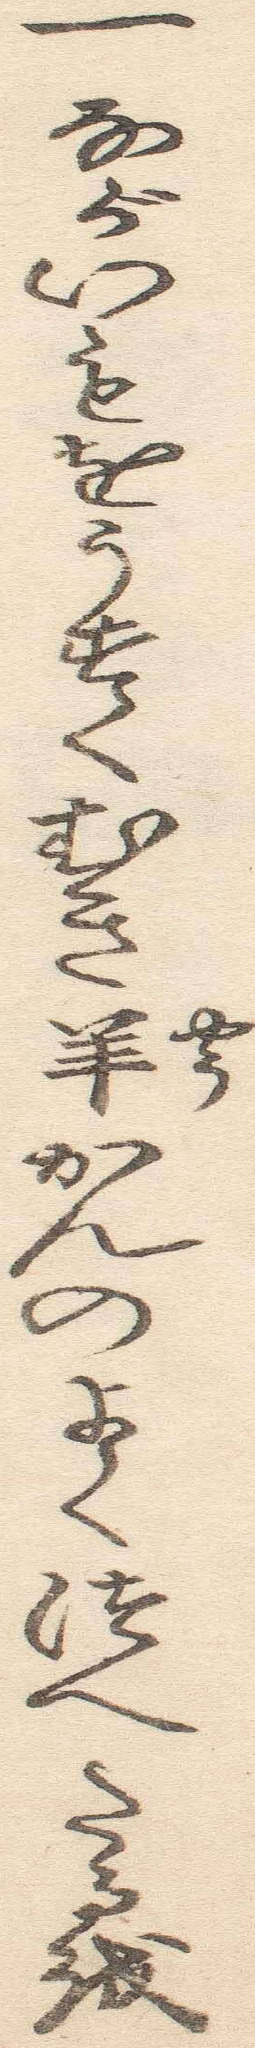一ながいもをうすくむき羊かんのよくつへたるを
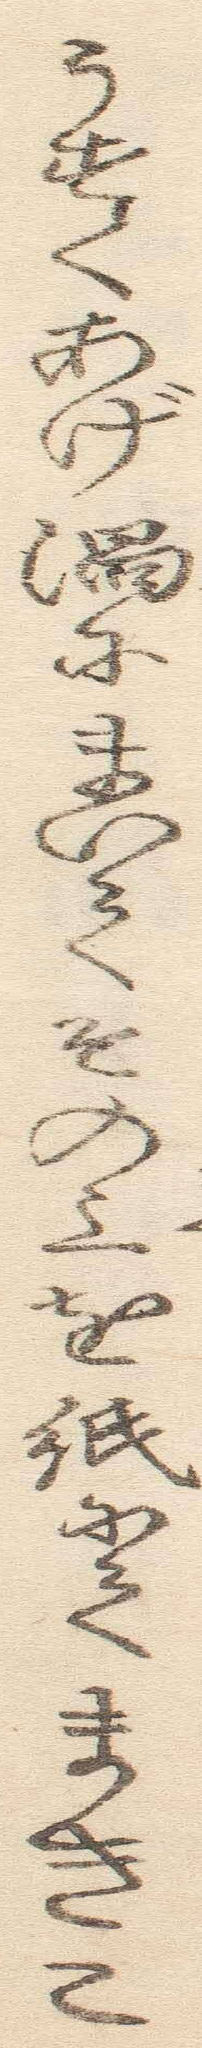うすくあげ渦にまいてその上を紙にてまきこ
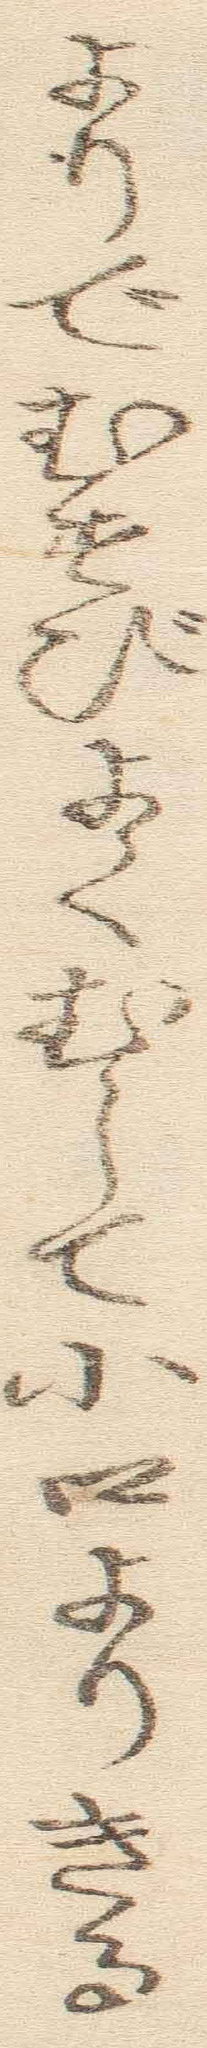よりでむすびよくむして小口よりきる
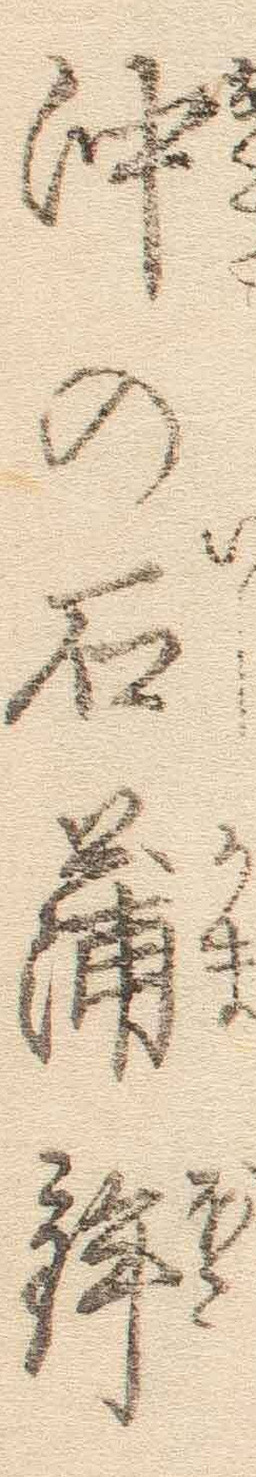沖の石蒲鉾

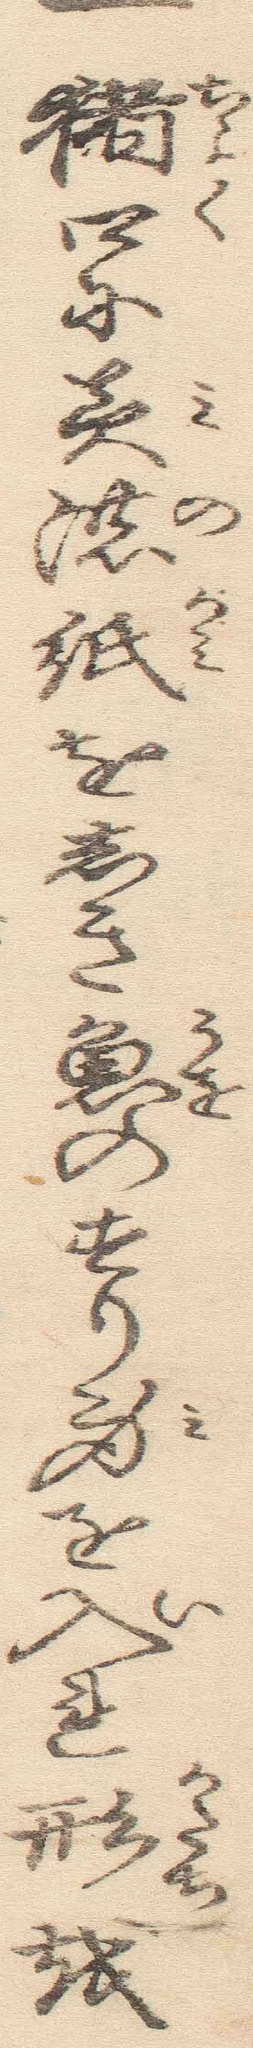一猪口に美濃紙をしき魚のすり身を入れ形を
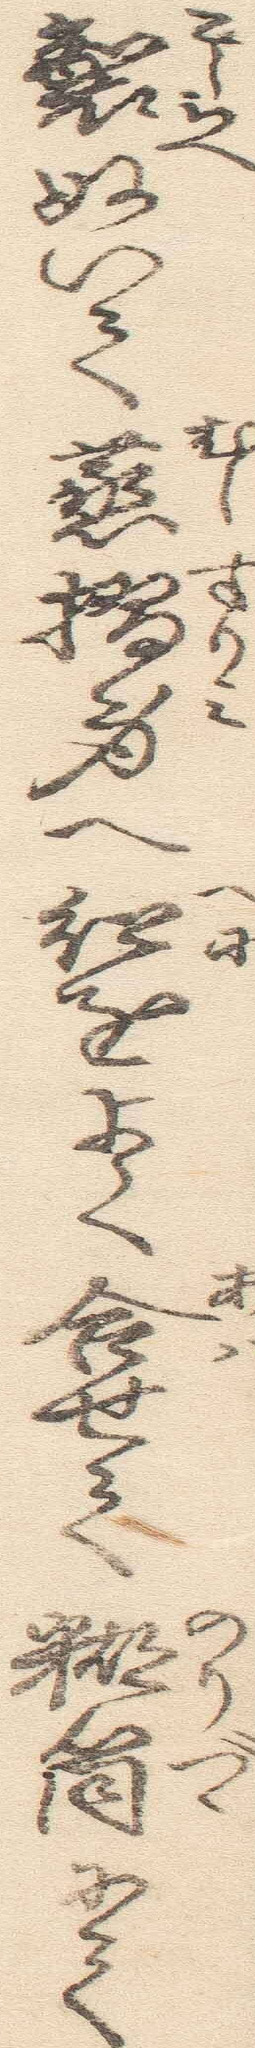製ぬいて蒸摺身へ紅をよく合せて糊筒にて
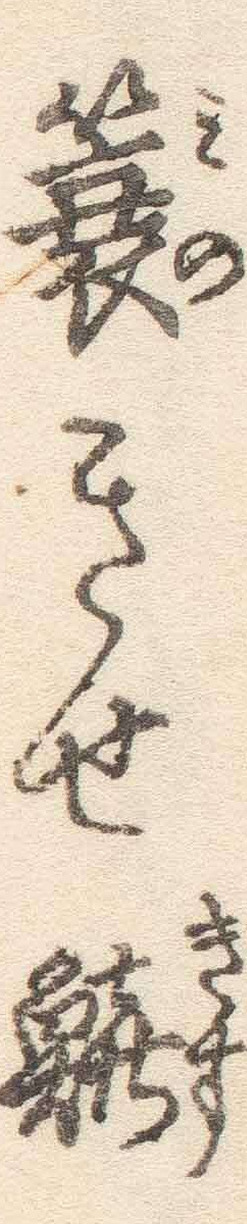蓑きせ鱚
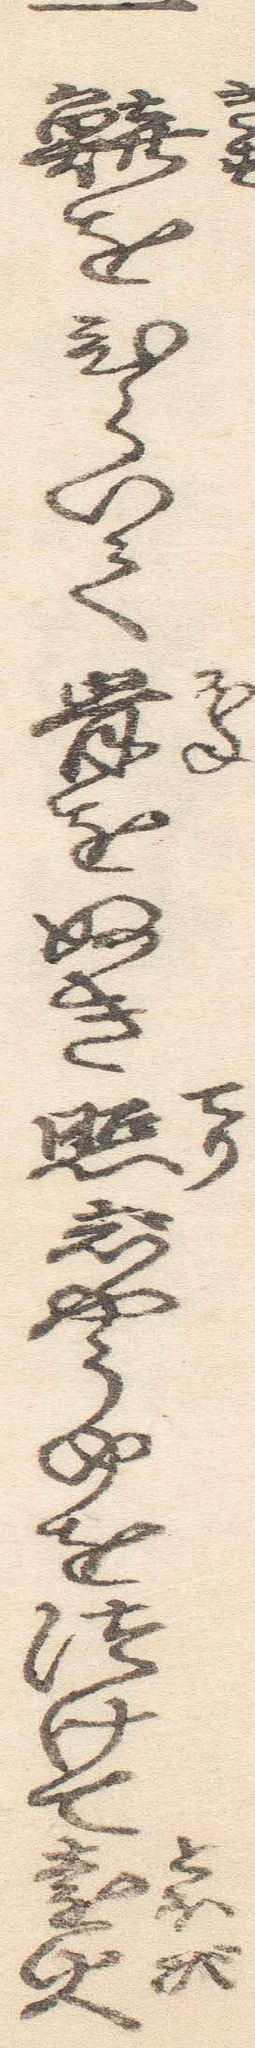一鱚をひらいて骨をぬき照じやうゆをつけて遠火
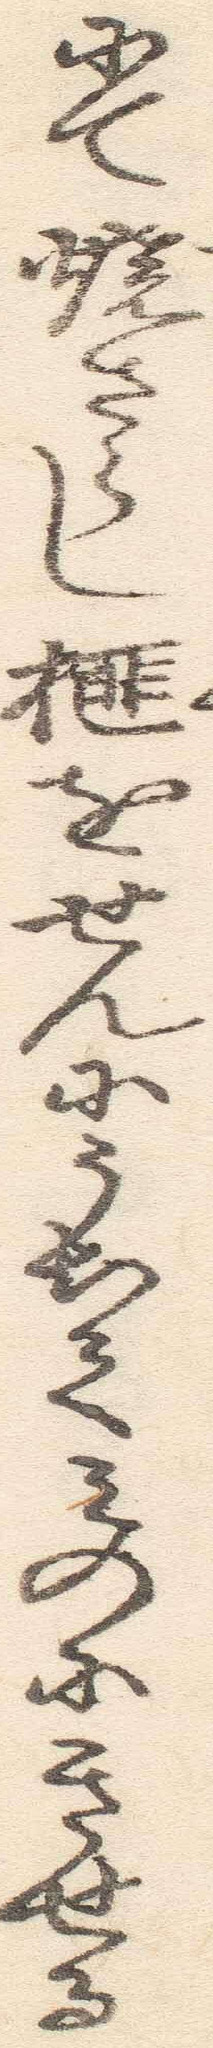にて焼さらし榧をせんにうちてみのにきせる
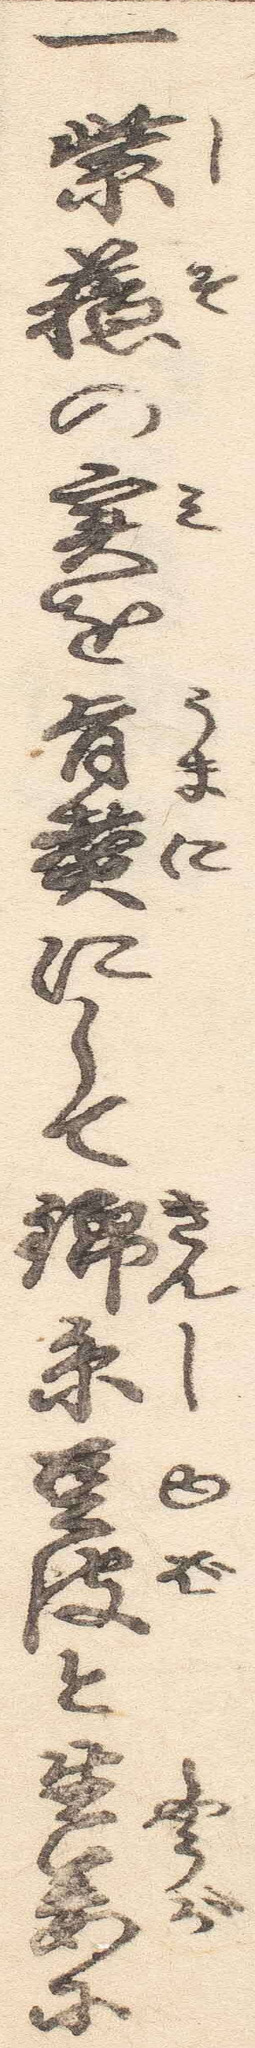一紫蘇の実を旨煮にして錦糸豆皮と生姜に
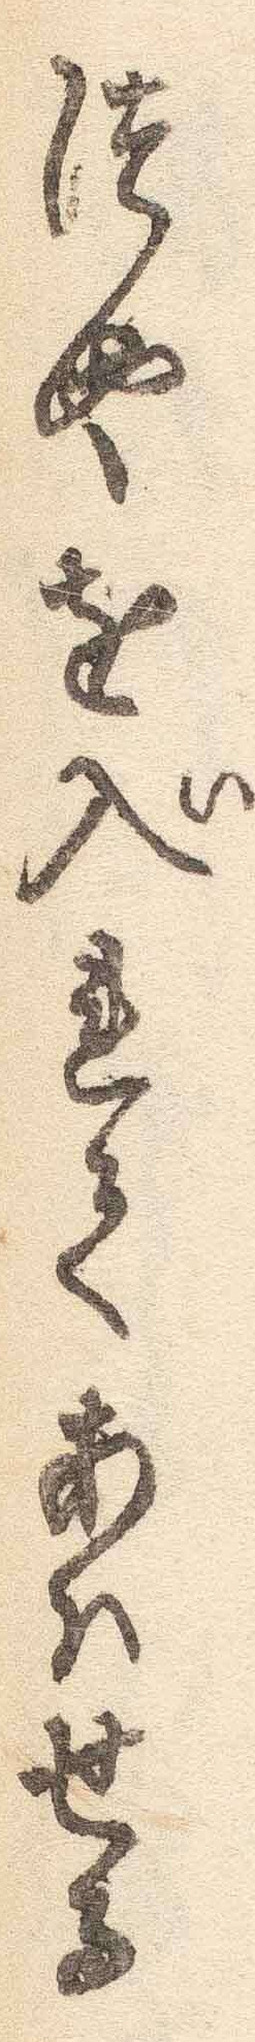つやを入れてあはせる
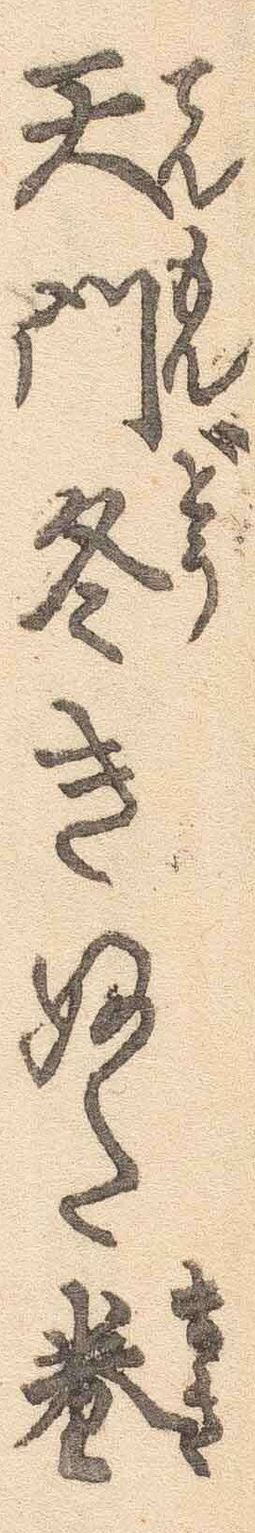天門冬きぬた巻
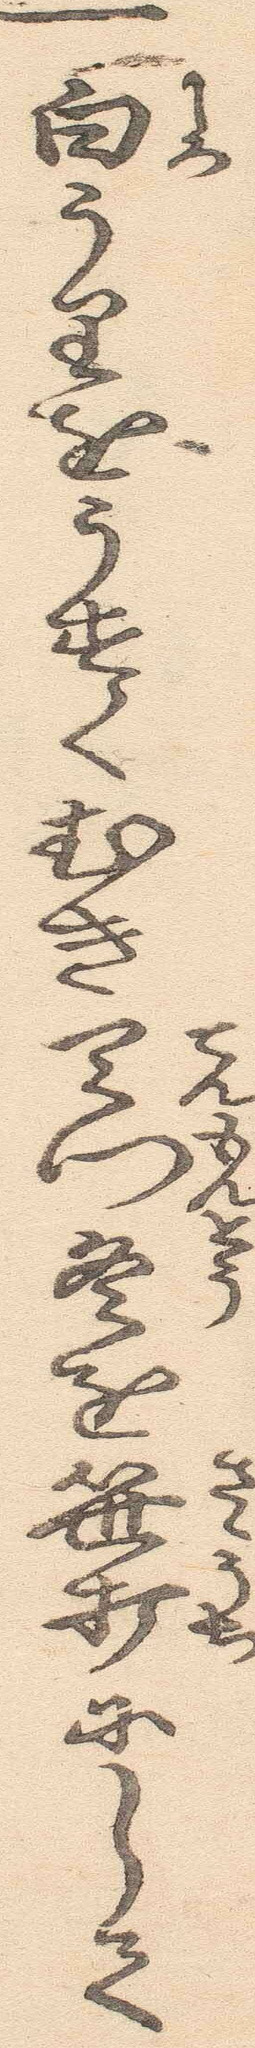一白うりをうすくむき天門冬を笹打にして
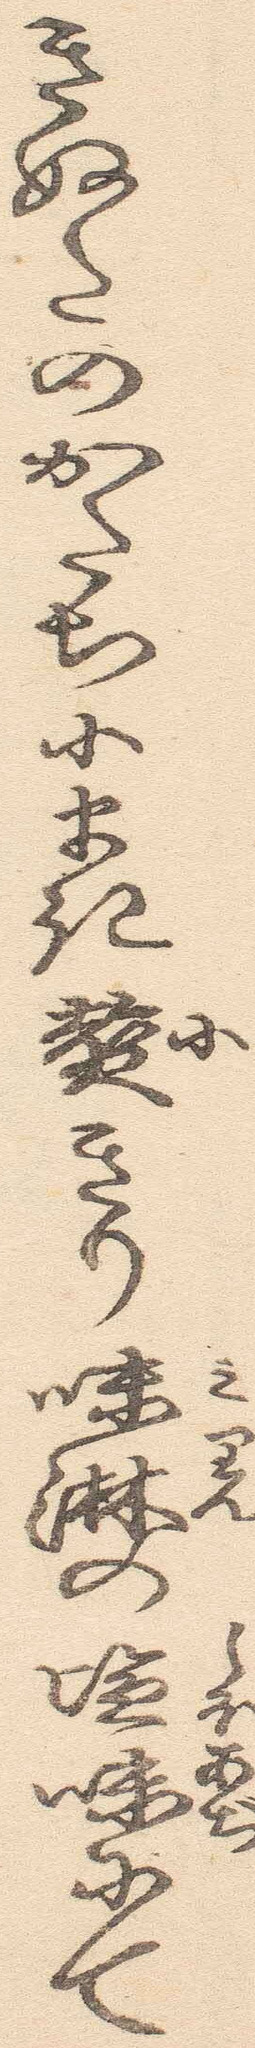きぬたのかたちにまき煮きり味淋の塩味にて
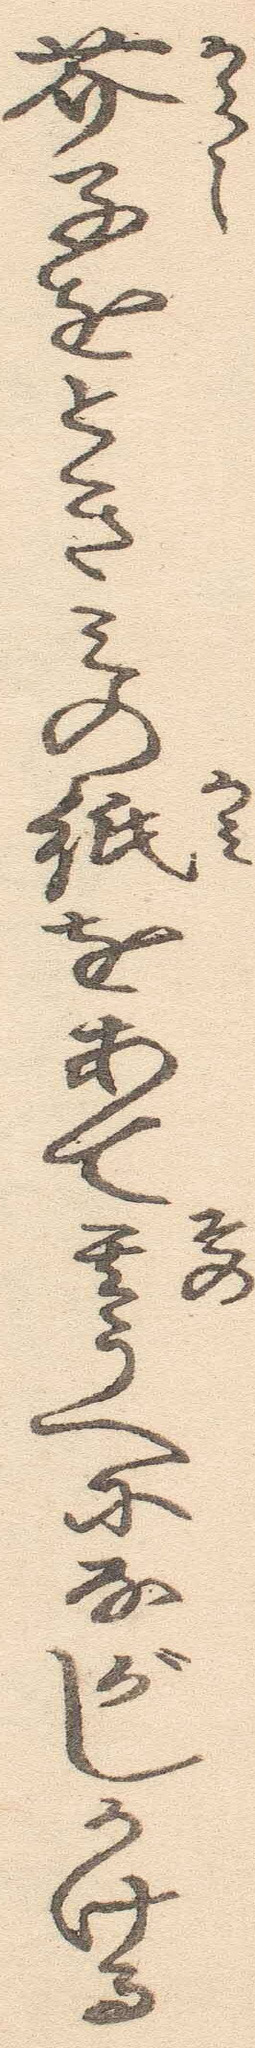芥子をときみの紙をあて其うへにながしかける
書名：料理通
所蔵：東京学芸大学附属図書館 国文学研究資料館
